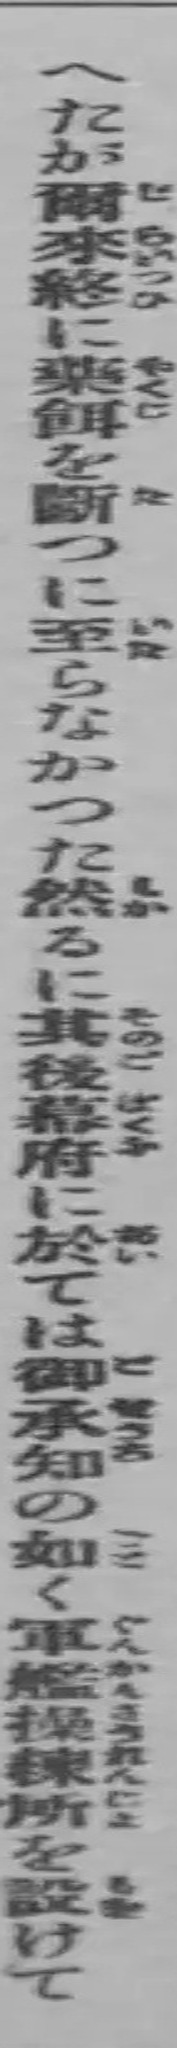へたが爾来終に薬餌を断つに至らなかつた然るに其後幕府に於ては御承知の如く軍艦操練所を設けて
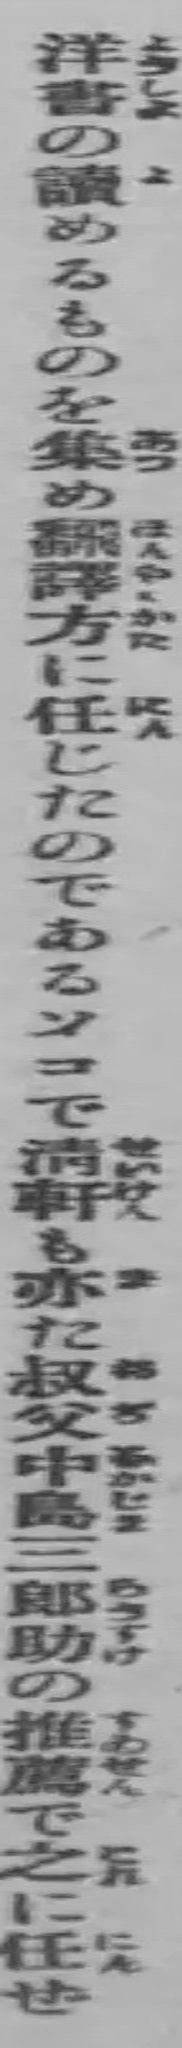洋書の読めるものを集め翻訳方に任じたのであるソコで清軒も亦た叔父中島三郎助の推薦で之に任ぜ
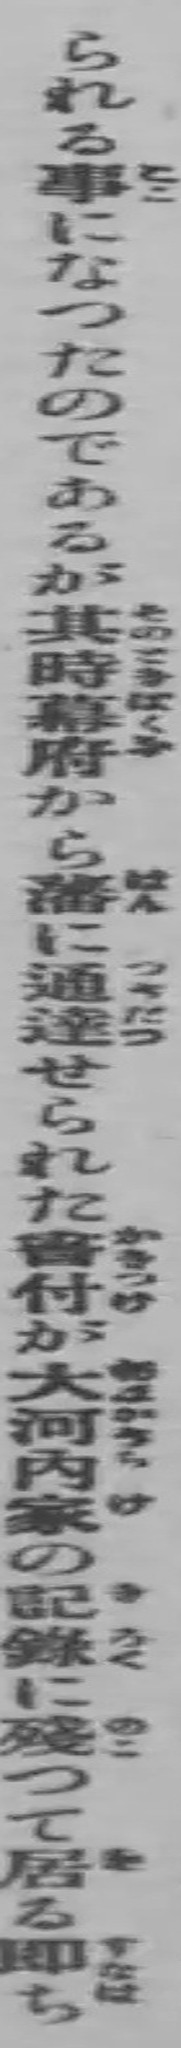られる事になつたのであるが其時幕府から藩に通達せられた書付が大河内家の記録に残つて居る即ち
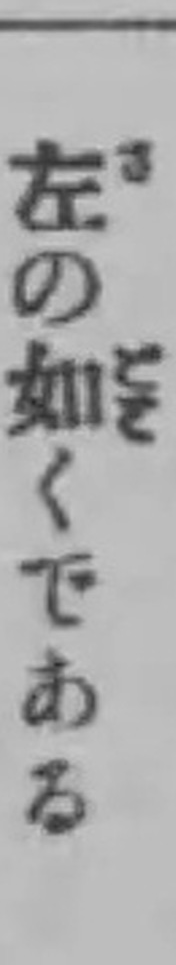左の如くである
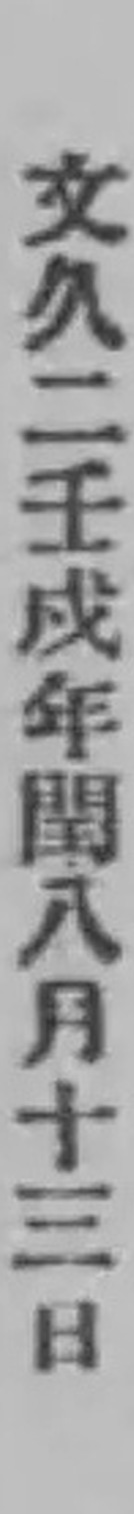文久二壬戌年閏八月十三日
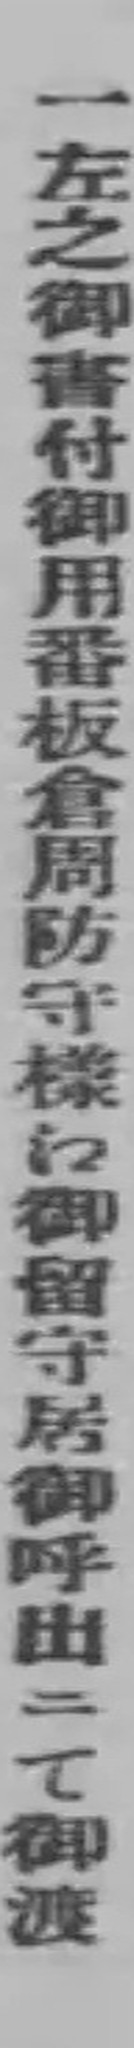一左之御書付御用番板倉周防守様え御留守居御呼出ニて御渡
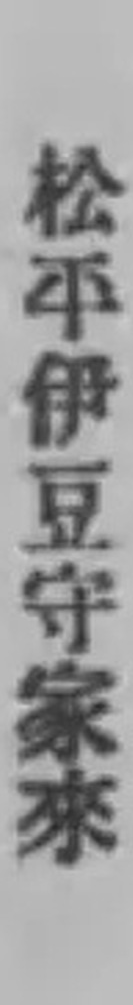松平伊豆守家来
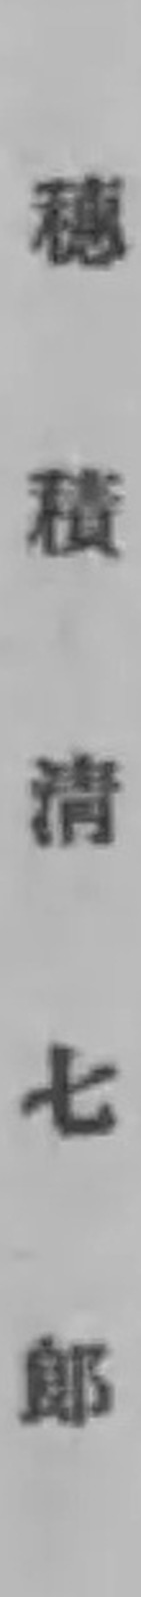穂積清七郎
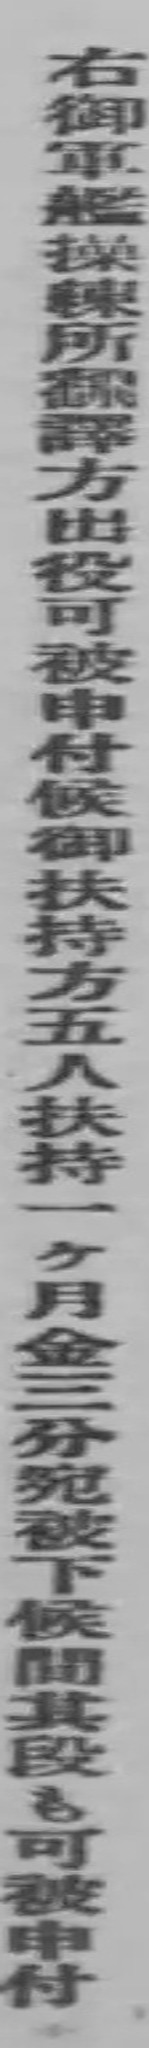右御軍艦操練所翻訳方出役可被申付候御扶持方五人扶持一ヶ月金三分宛被下間其段も可被申付
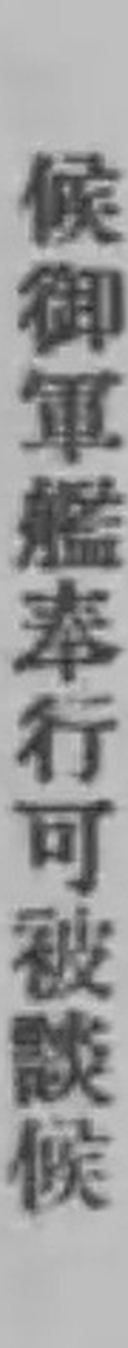候御軍艦奉行可被談候
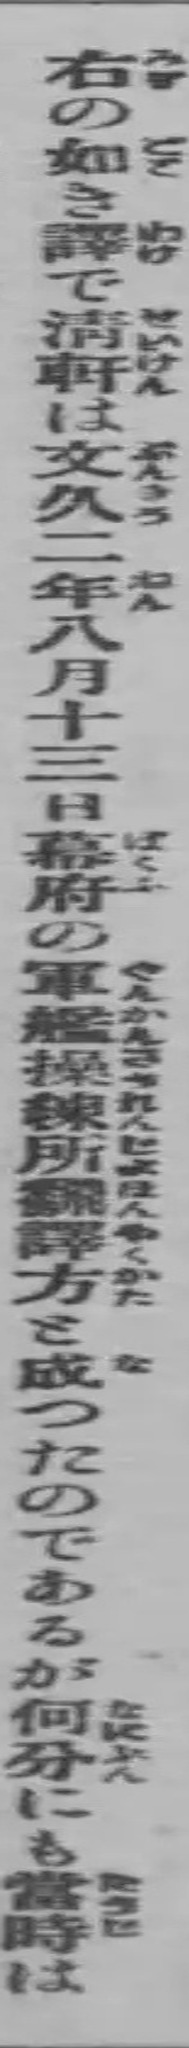右の如き訳で清軒は文久二年八月十三日幕府の軍艦操練所翻訳方と成つたのであるが何分にも当時は
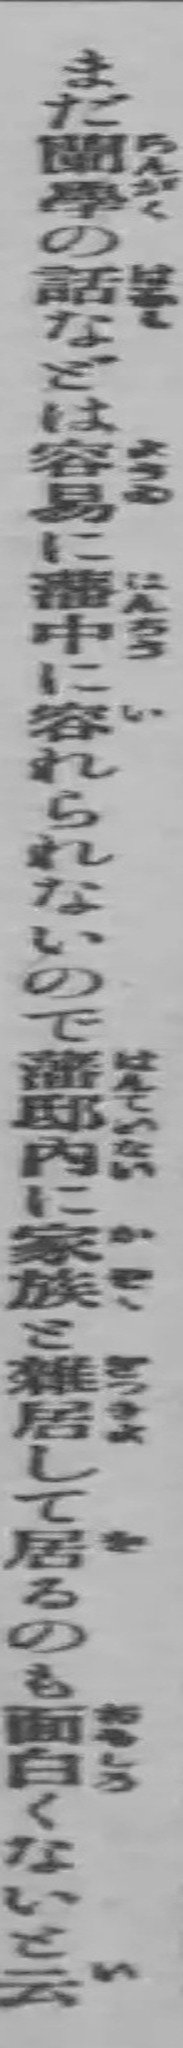まだ蘭学の話などは容易に藩中に容れられないので藩邸内に家族と雑居して居るのも面白くないと云
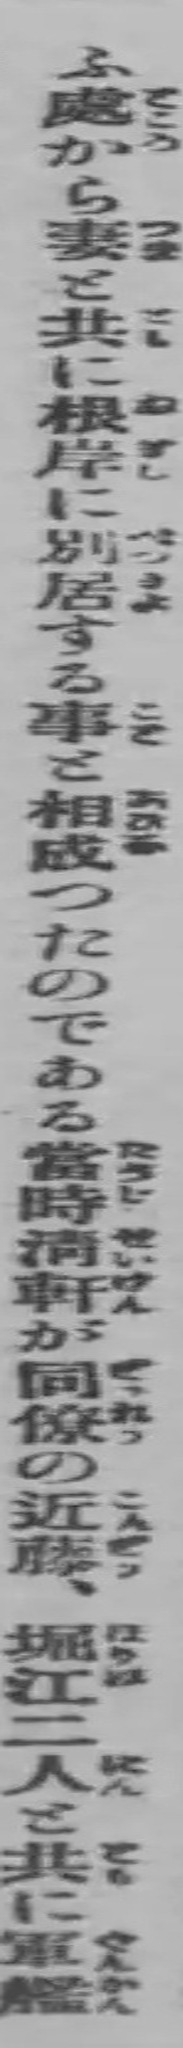ふ処から妻と共に根岸に別居する事と相成つたのである当時清軒が同僚の近藤、堀江二人と共に軍艦
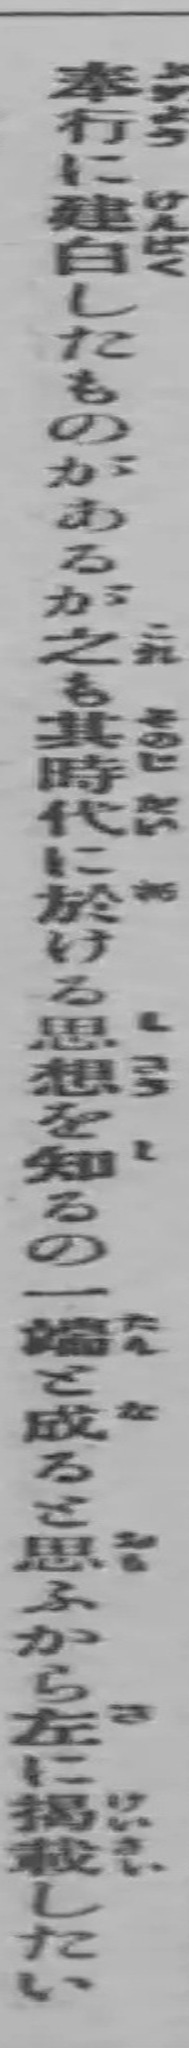奉行に建白したものがあるが之も其時代に於ける思想を知るの一端と成ると思ふから左に掲載したい
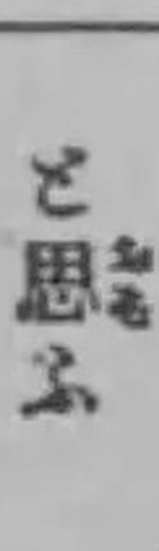と思ふ

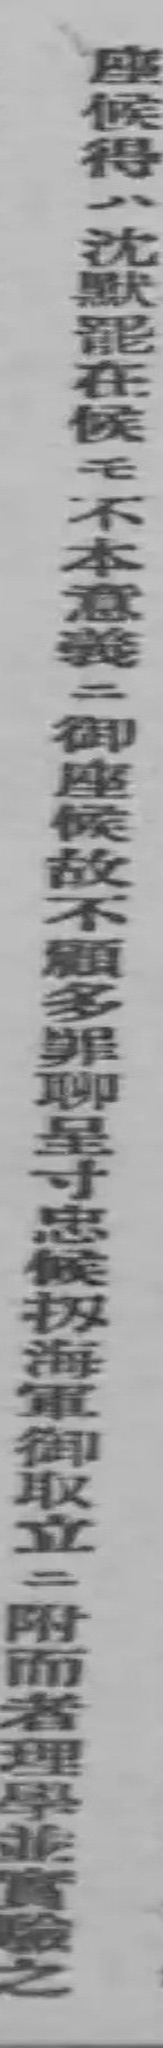座候得ハ沈黙罷在候モ不本意義ニ御座候故不顧多罪聊呈寸忠候扨海軍御取立ニ附而者理学並実験之
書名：豊橋市史談
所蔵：国立国会図書館 National Diet Library, JAPAN
